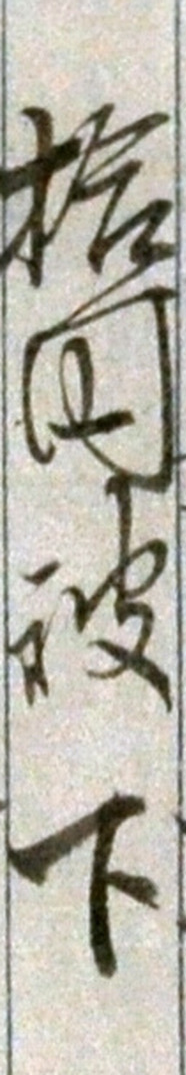拾円被下
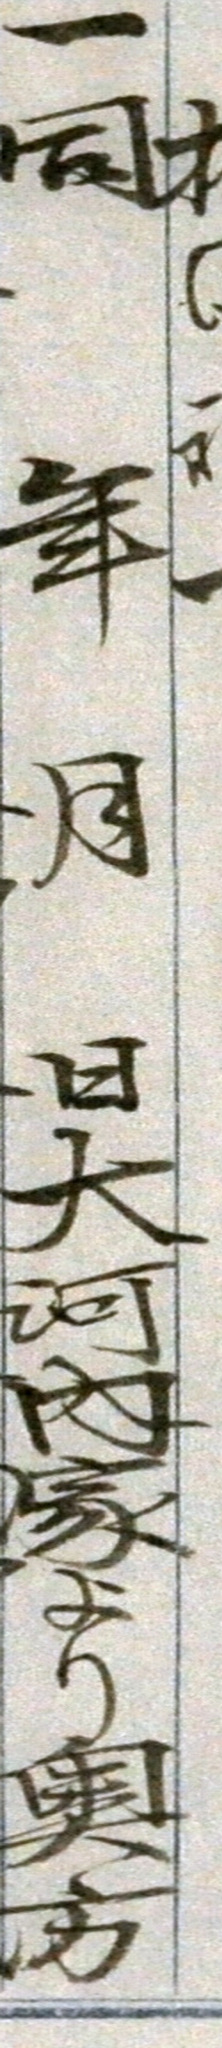一同年月日大河内家より奥方
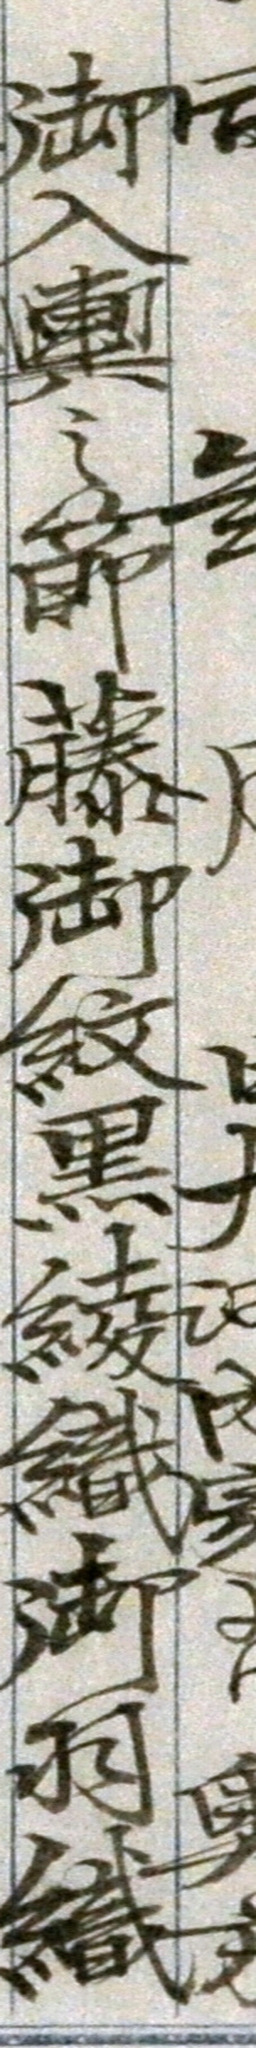御入輿之節藤御紋黒綾織御羽織
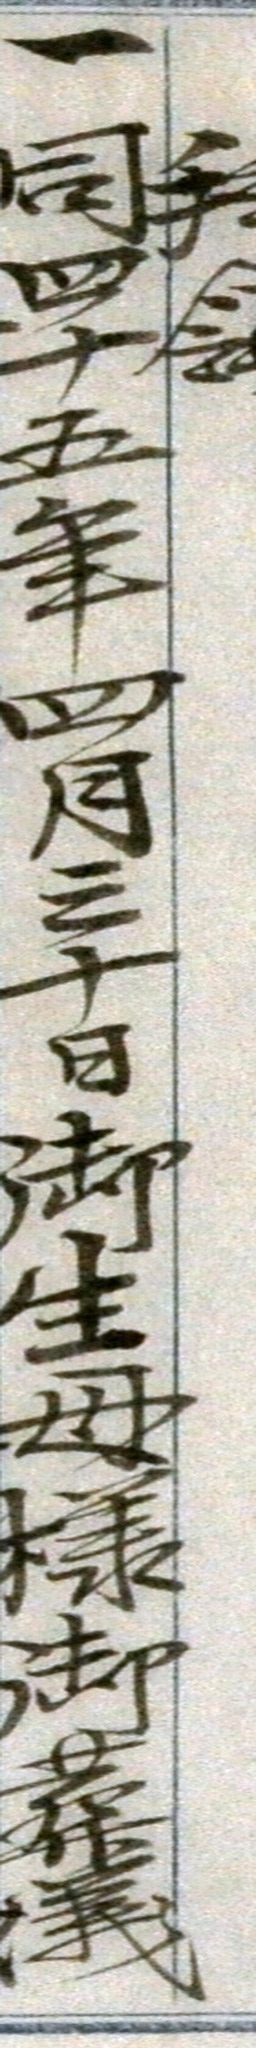一同四十五年四月三十日御生母様御葬儀
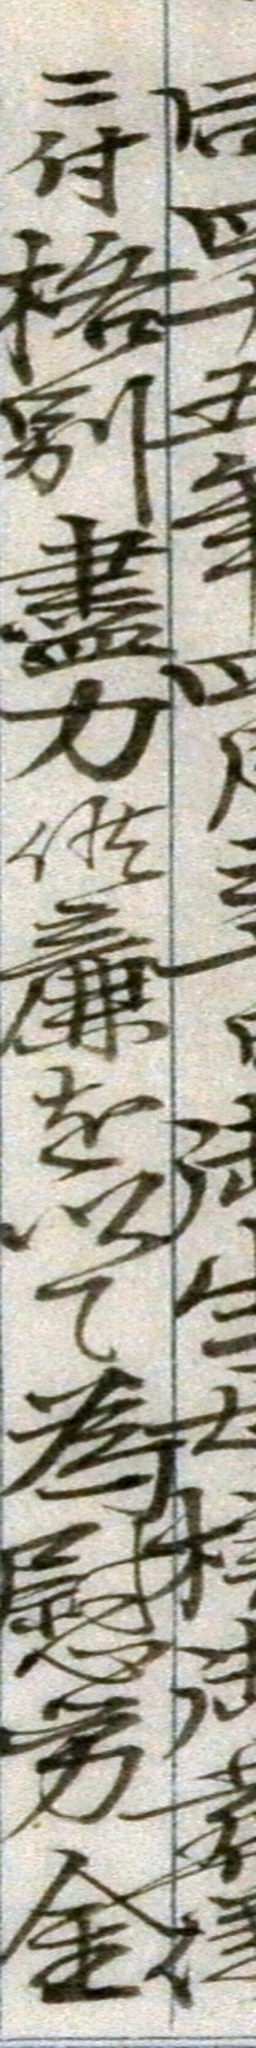ニ付格別尽力候廉を以て為慰労金
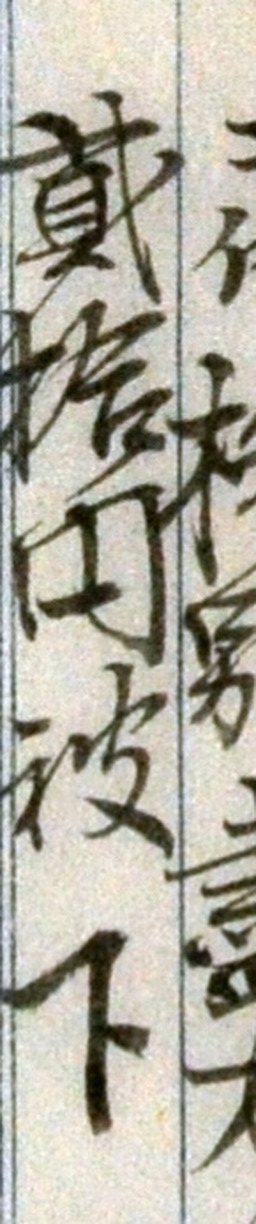弐拾円被下
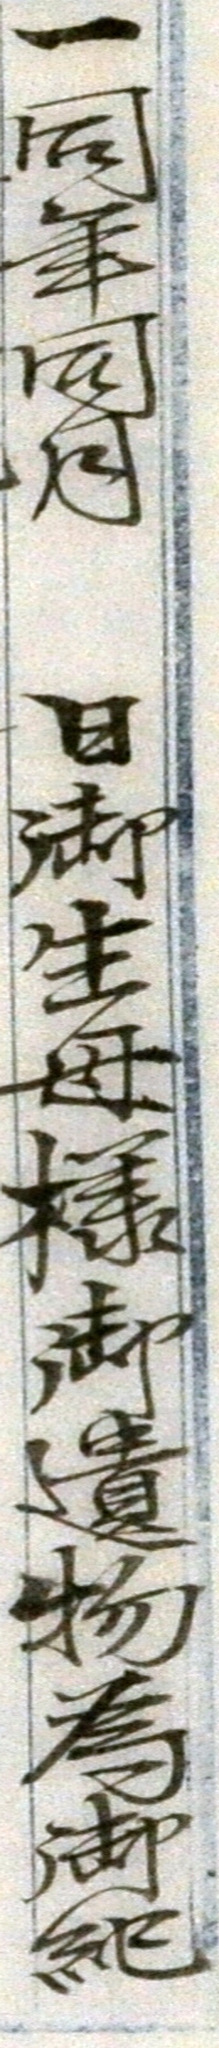一同年同月日御生母様御遺物為御記
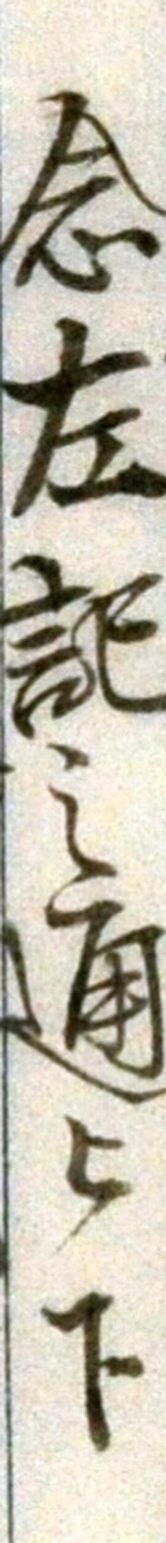念左記之通被下
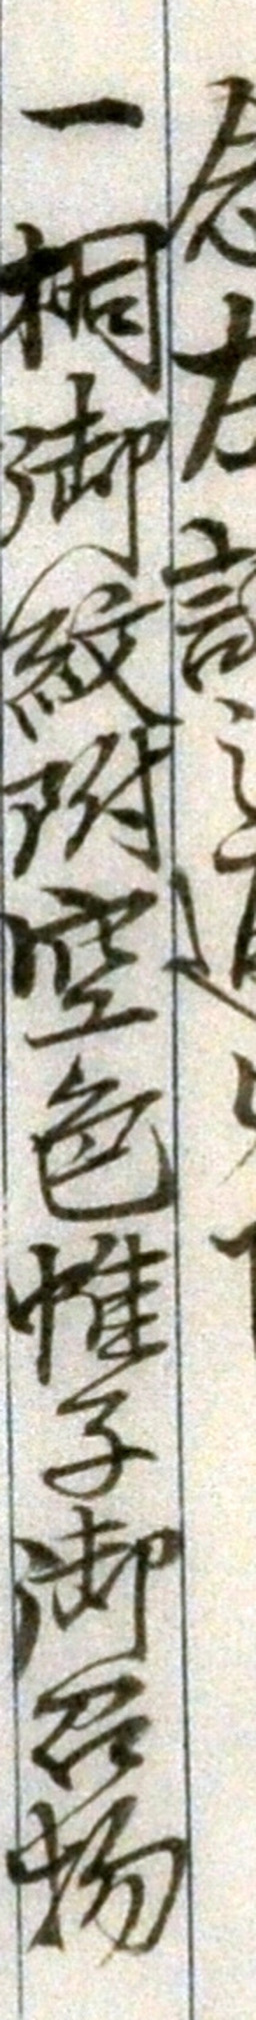一桐御紋付空色帷子御召物壱枚
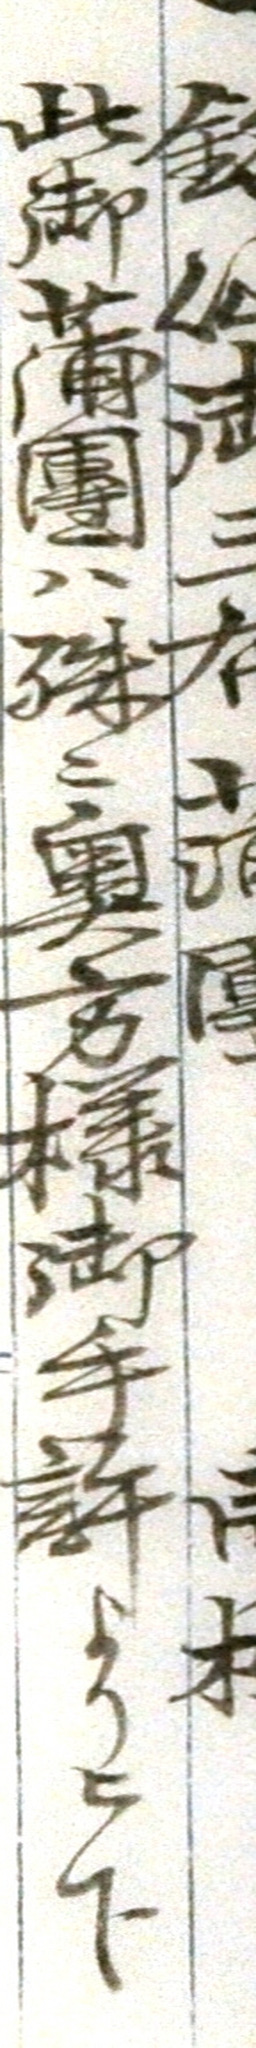此御蒲団ハ殊ニ奥方様御手許より被下

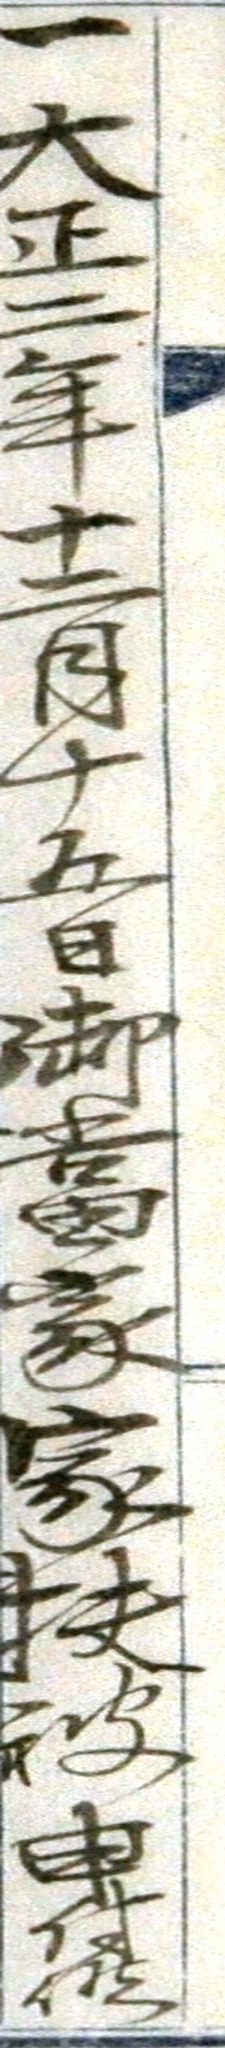一大正二年十二月十五日御当家家扶被申付候
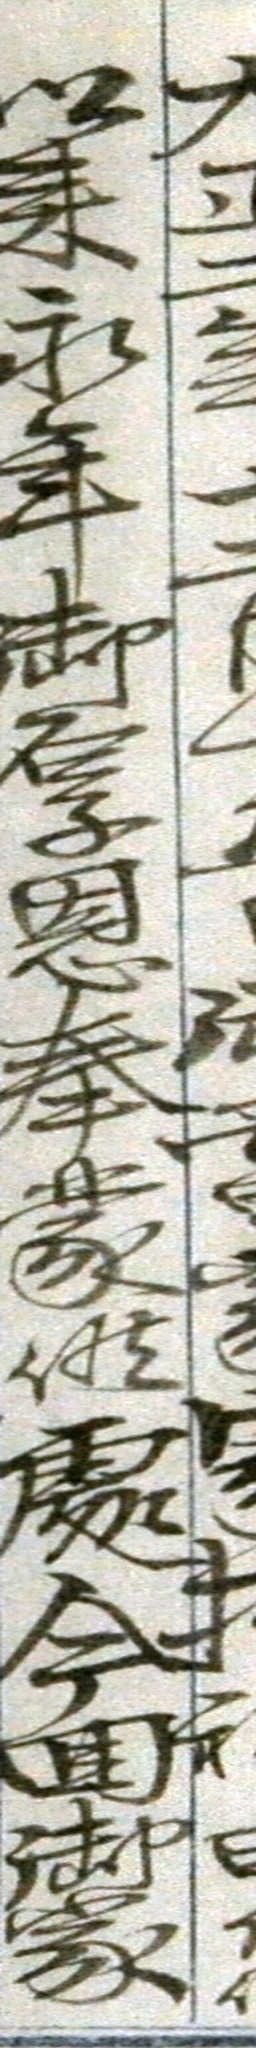以来永年御厚恩奉◻︎候処今回御家
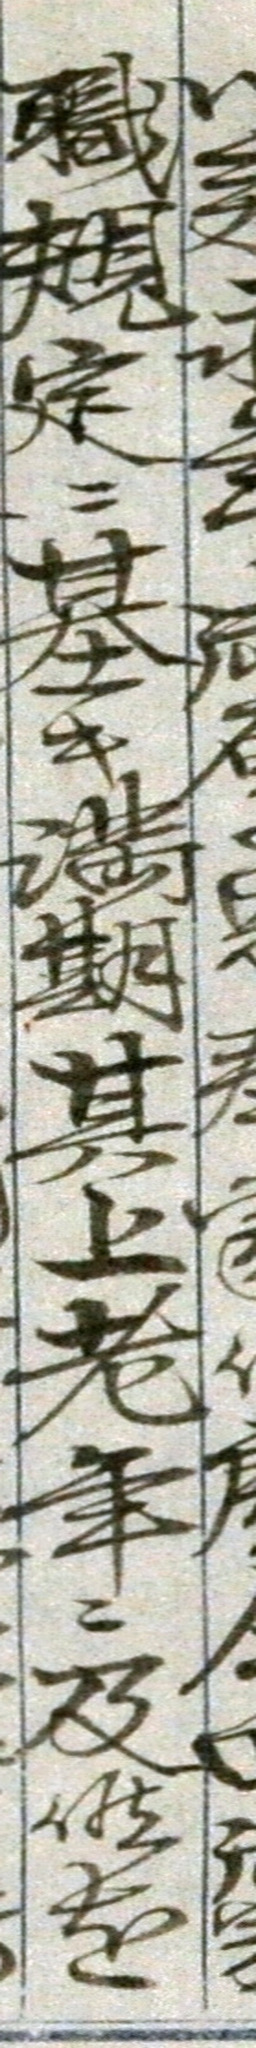職規定ニ基キ満期其上老年ニ及候を
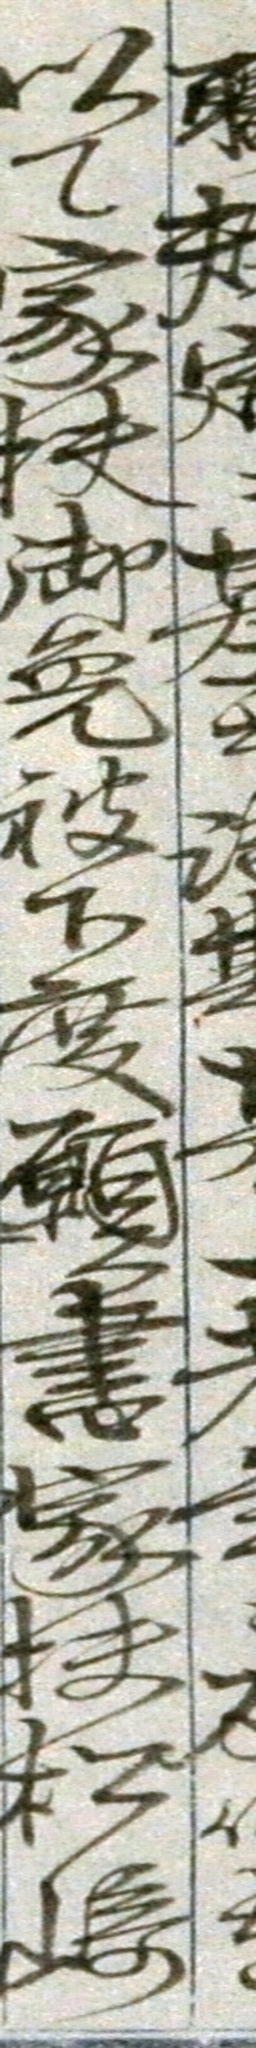以て家扶御免被下度願書家扶松嶋
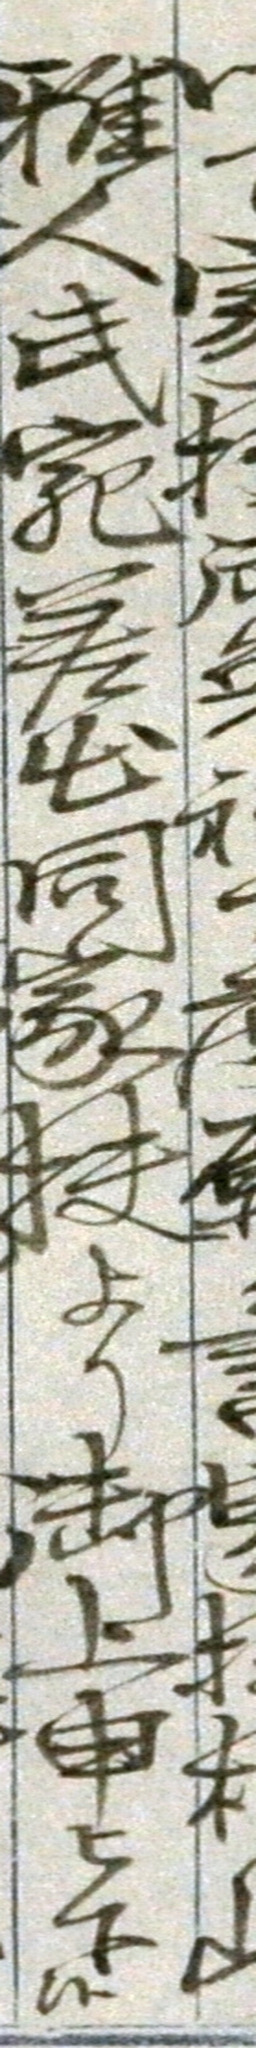雅人氏宛差出同家扶より御上申被下候
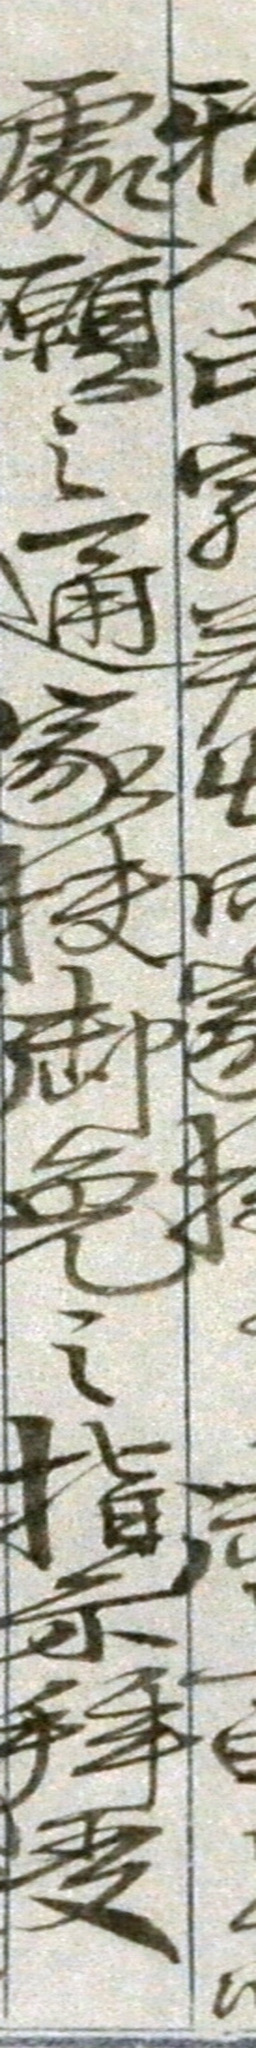処願之通家扶御免之指示拝受
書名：三好氏先代以来勤仕録、池田丈介一家勤仕録
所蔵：伊那市立高遠町図書館・合同会社AMANE
